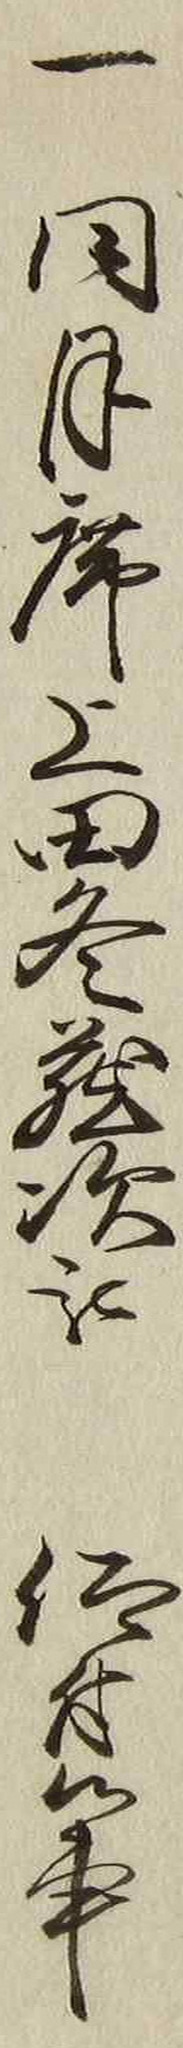一同月席上田冬蔵次被仰付候事
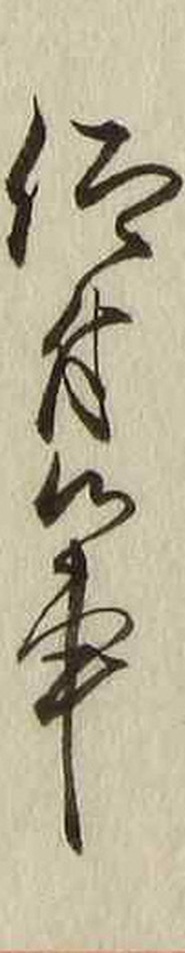仰付候事
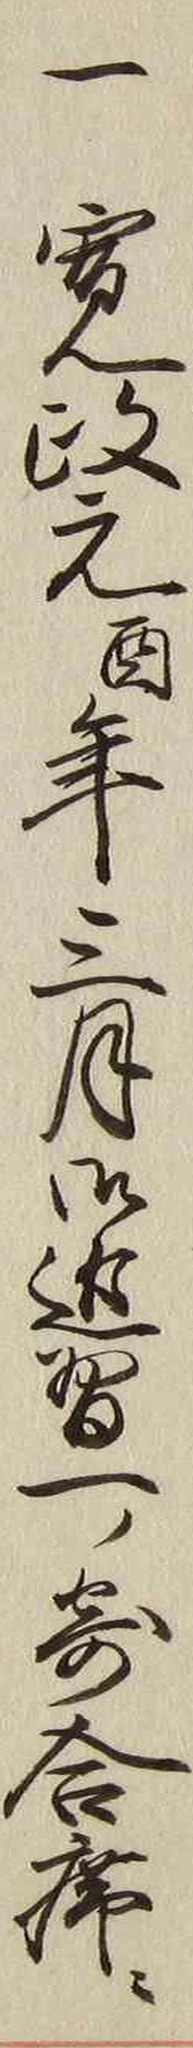一寛政元酉年三月御近習一ノ寄合席ニ
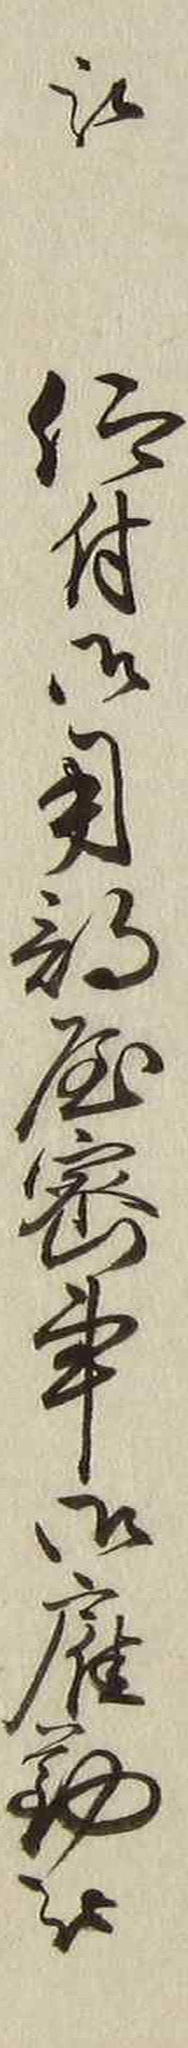被仰付御用部屋密事御雇勤被
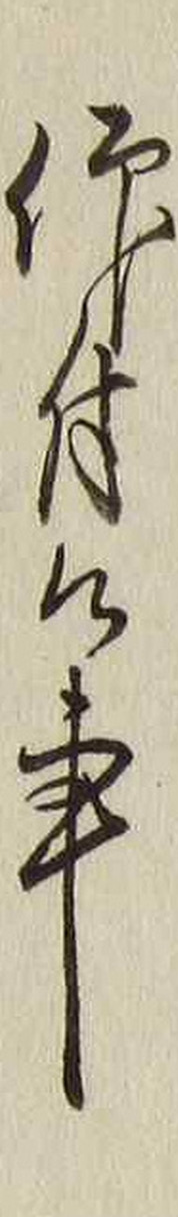仰付候事
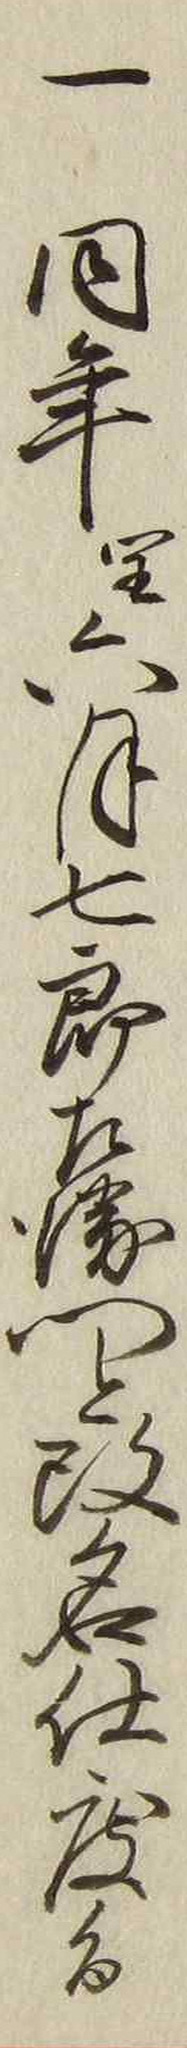一同年閏六月七郎左衛門と改名仕度旨
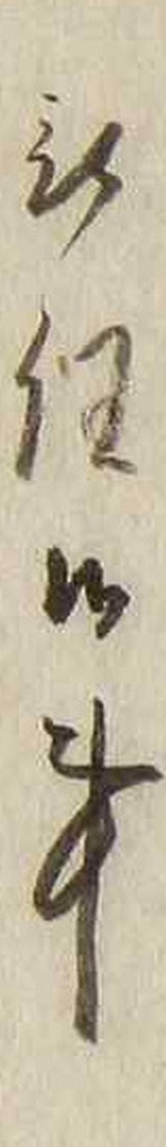被任候事

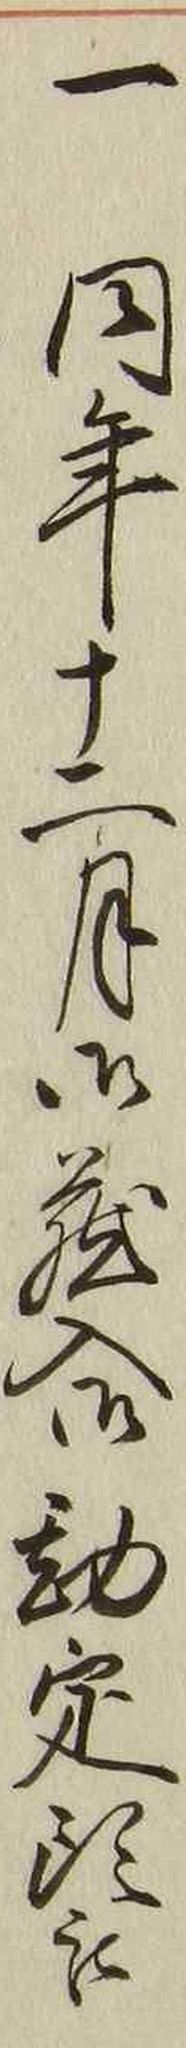一同年十二月御蔵入御勘定頭被
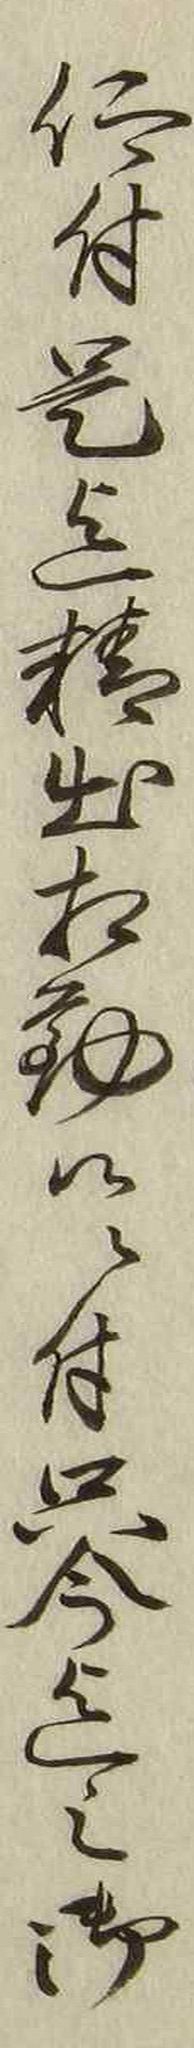仰付是迄精出相勤候ニ付只今迄之御
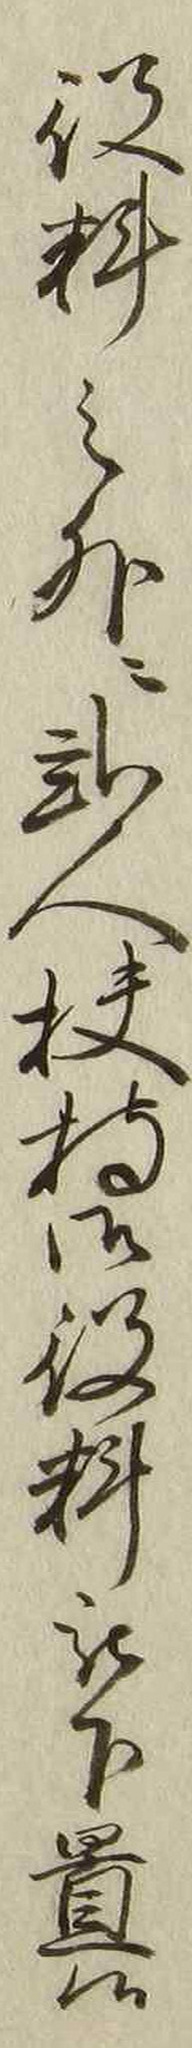役料之外ニ弐人扶持御役料被下置候
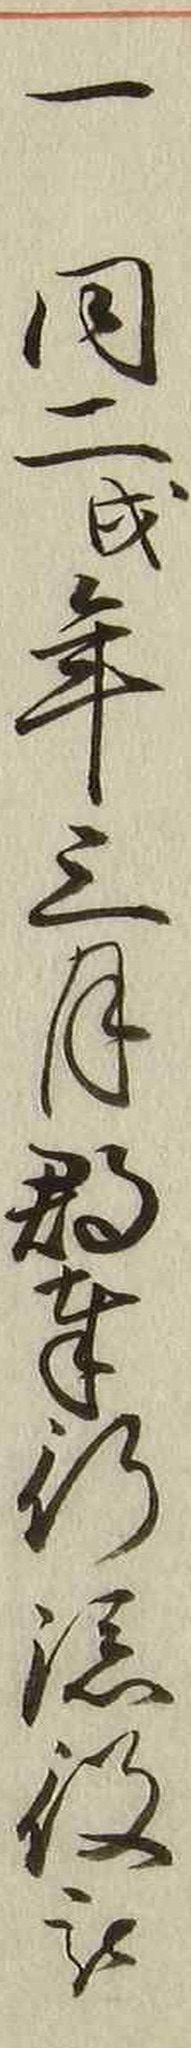一同二戌年三月郡奉行添役被
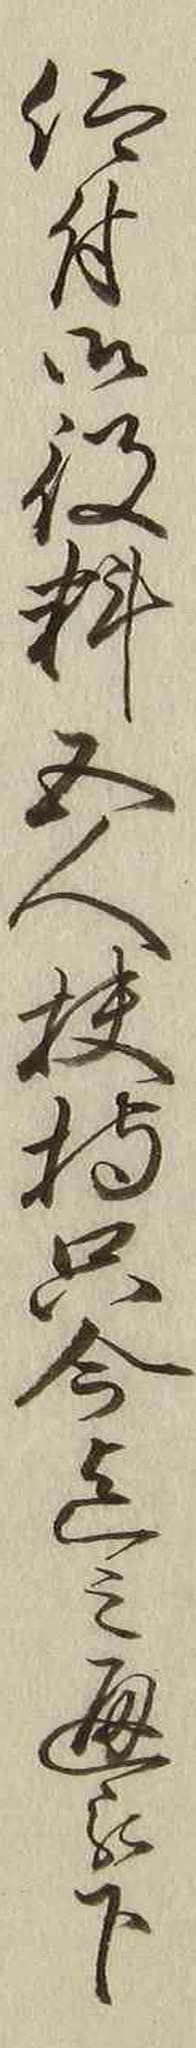仰付御役料五人扶持只今迄之通被下
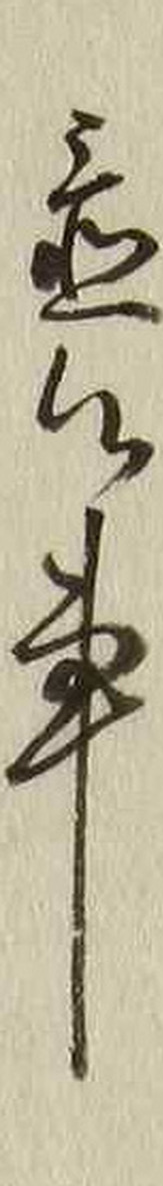置候事
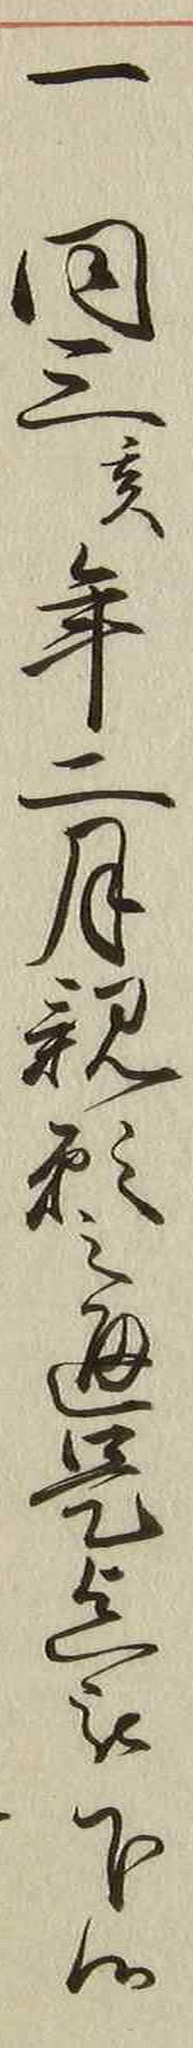一同三亥年二月親願之通是迄被下候
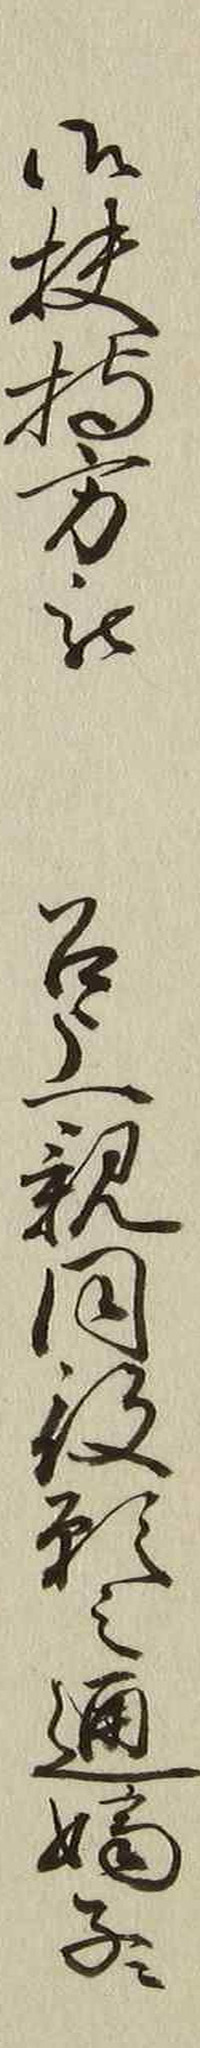御扶持方被召上親同役願之通嫡子ニ
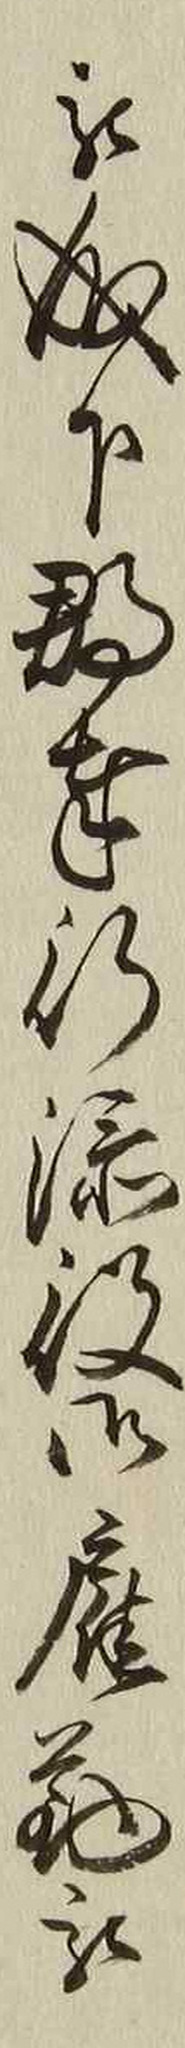被成下郡奉行添役御雇勤被
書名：諸士系譜　巻之21　い之部21
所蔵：会津若松市立会津図書館
